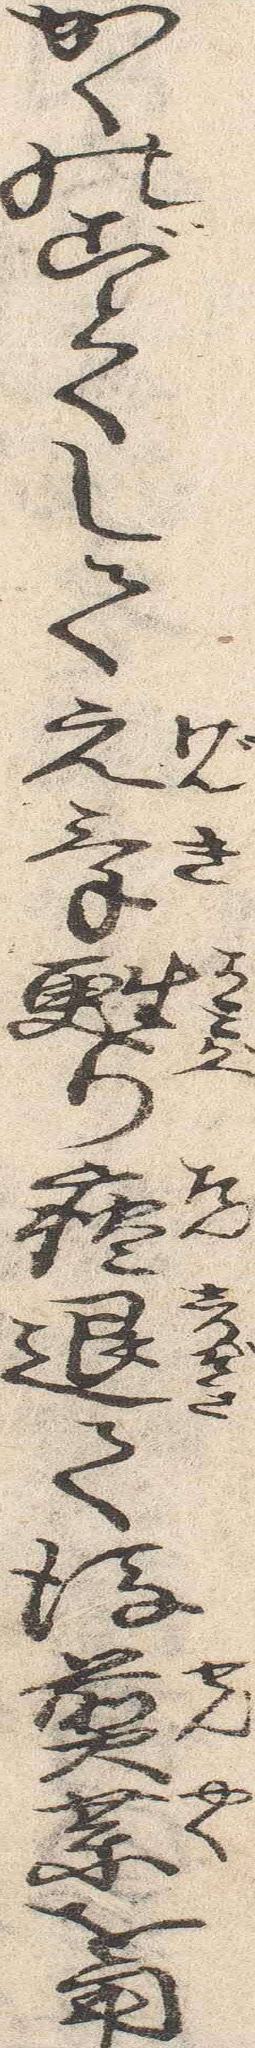かくのごとくして元気甦り痰退て後煎薬を用
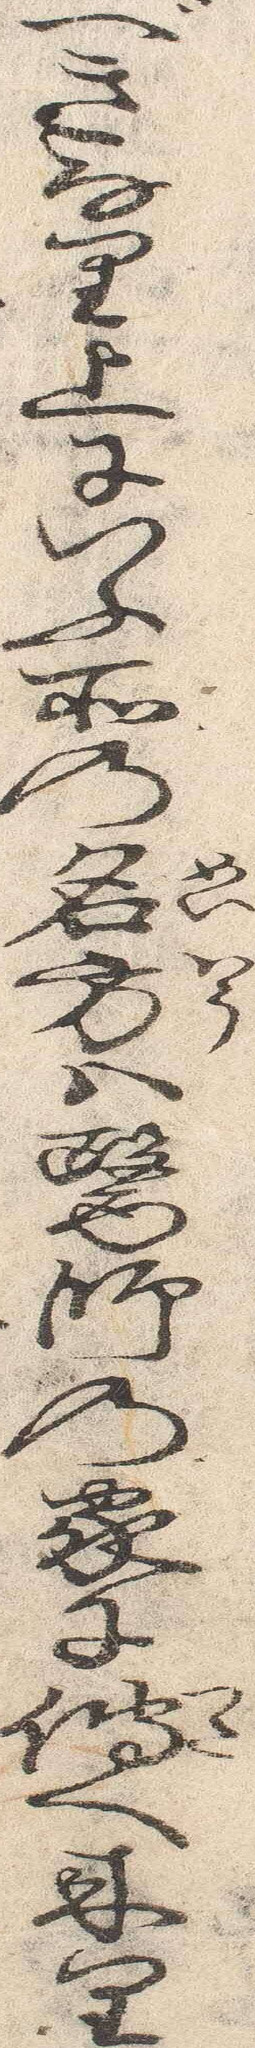べきなり上にいふ所の名方は医師の家に伝へ来り
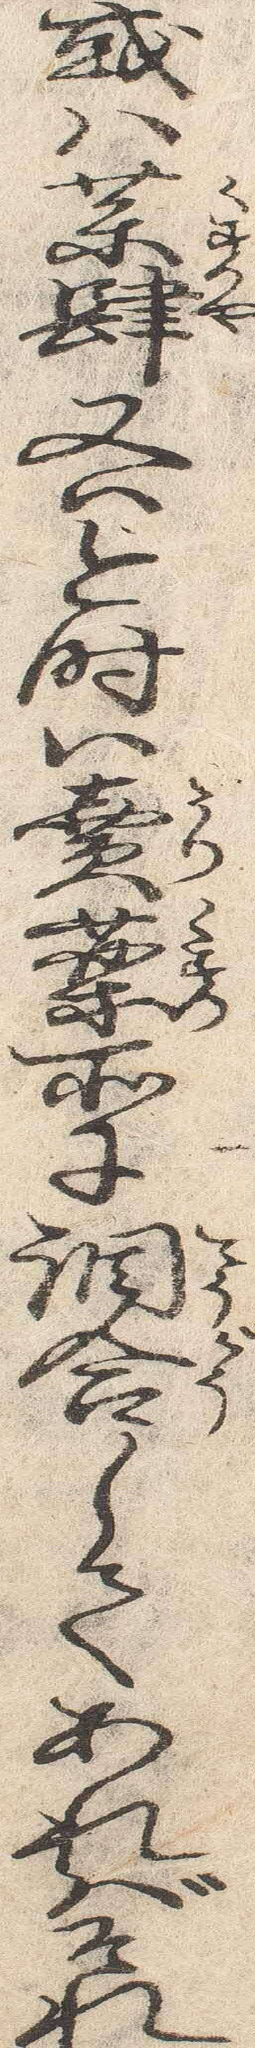或は薬肆又は今時は売薬所に調合してあればそれ
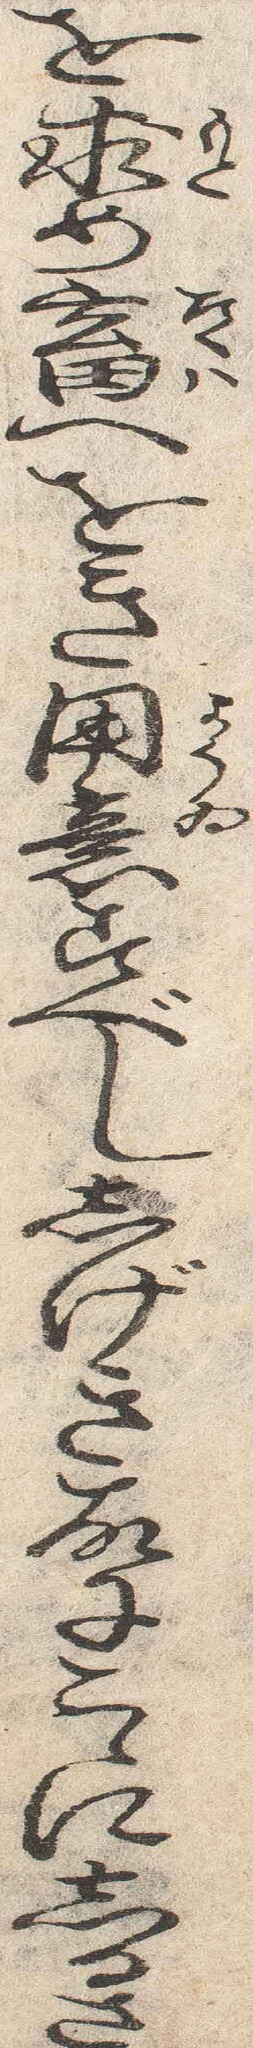を求め畜へをき用意すべししげき故にこゝにしるさ
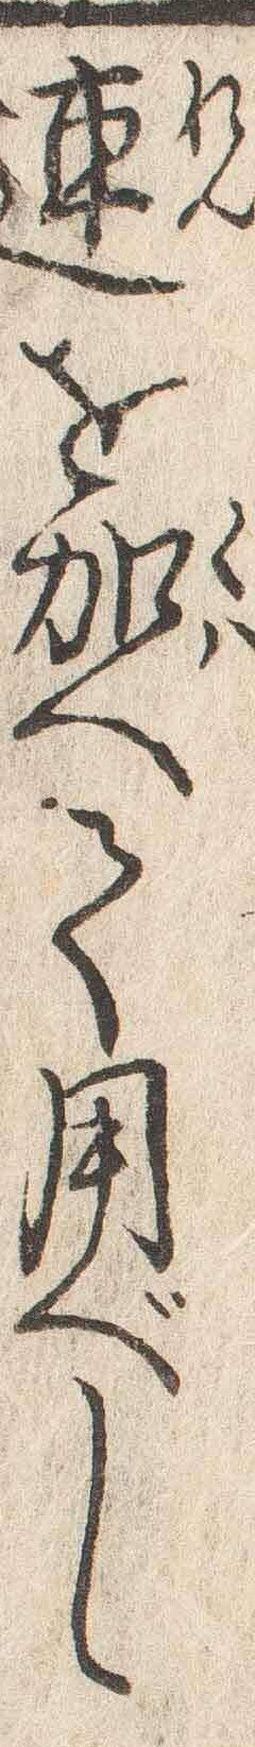連を加へて用べし
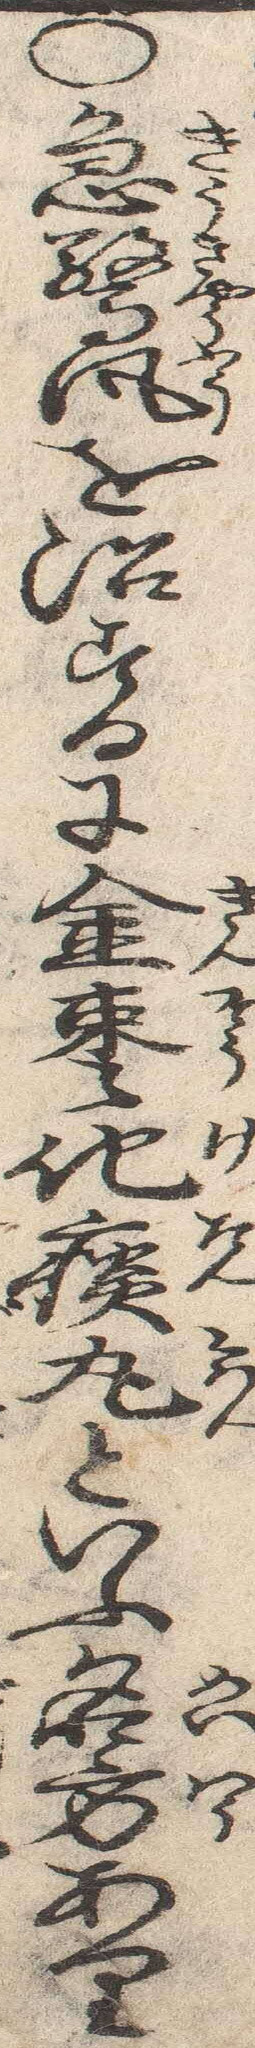○急驚風を治するに金棗化痰丸といふ名方あり

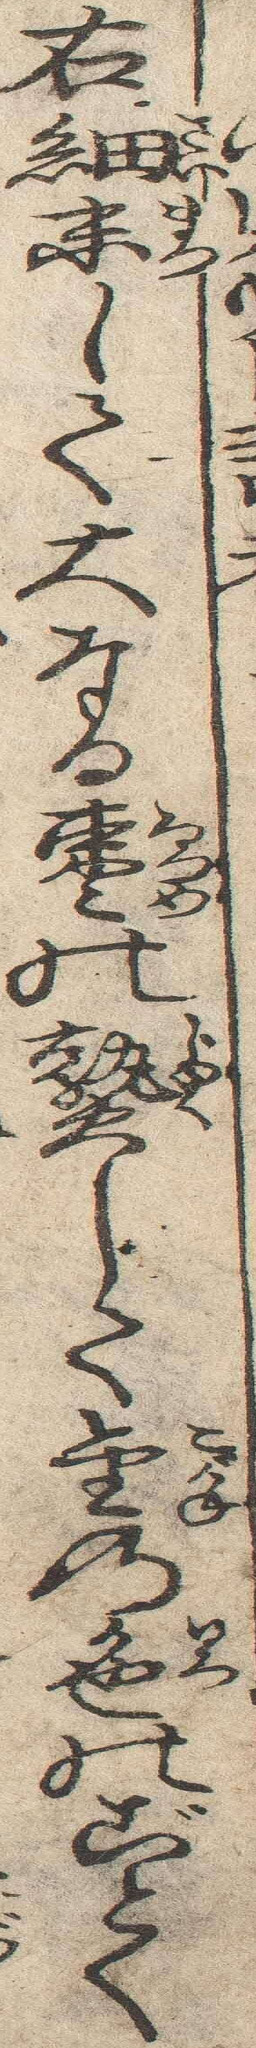右細末して大なる棗の熟して金の色のごとく
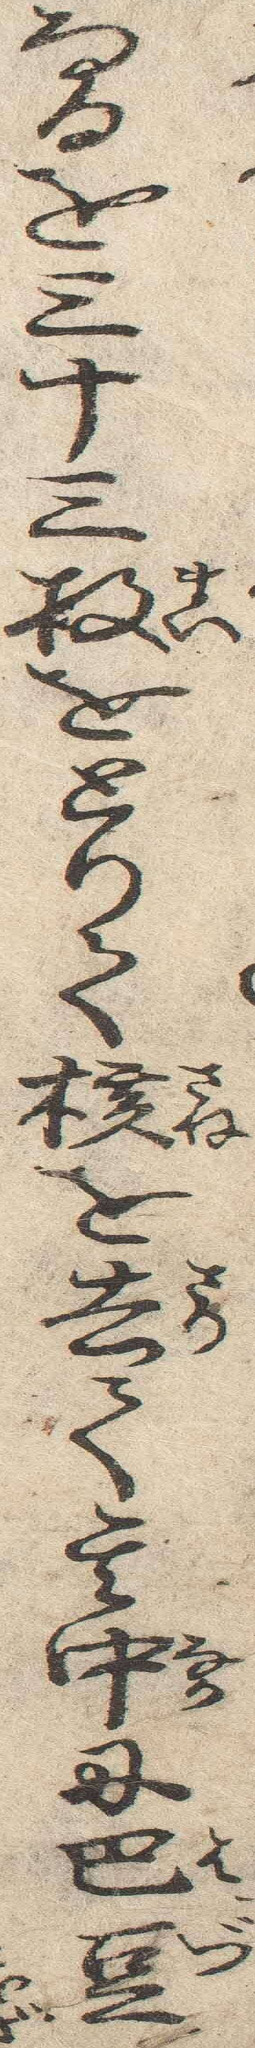なるを三十三枚をとりて核を去て其中に巴豆
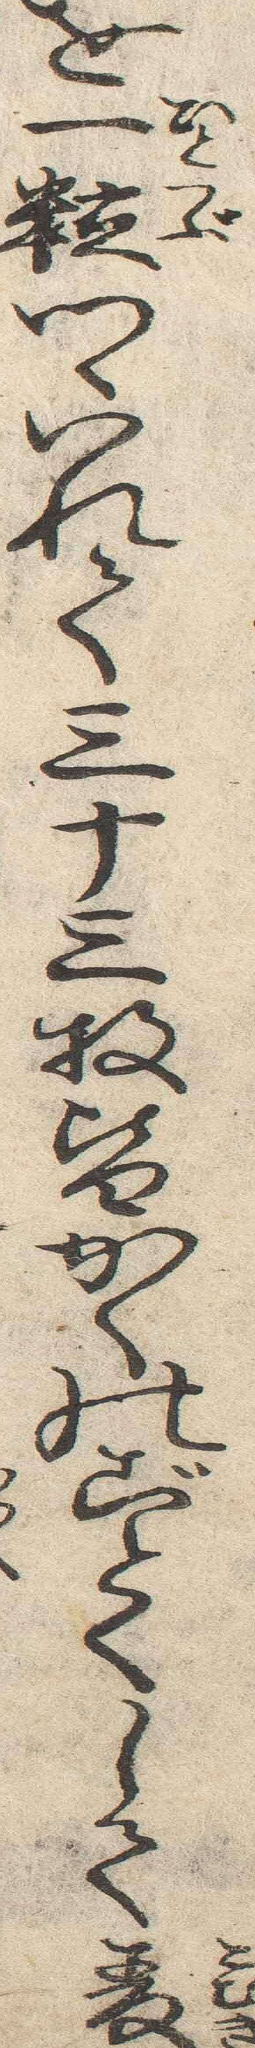を一粒ツヽいれて三十三枚皆かくのごとくして麦
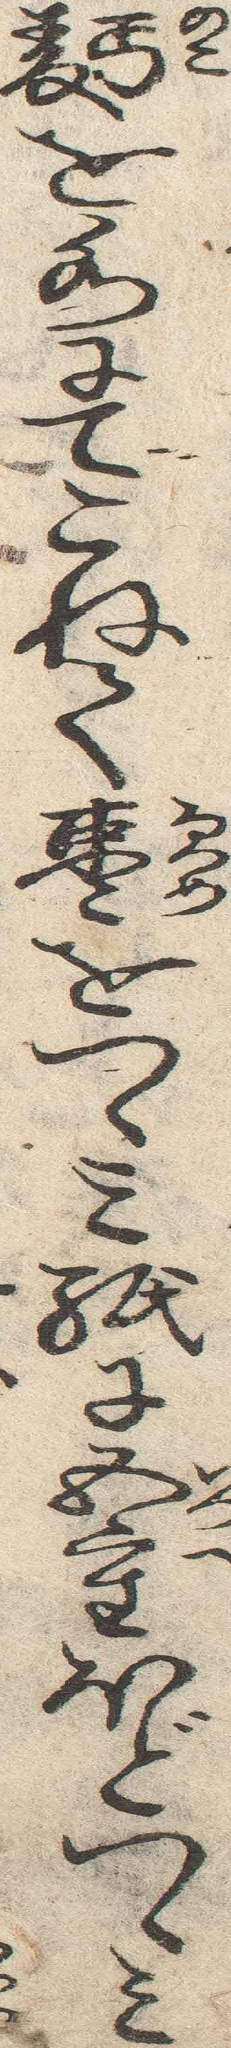麪を水にてこねて棗をつゝみ紙に五重ほどつゝみ
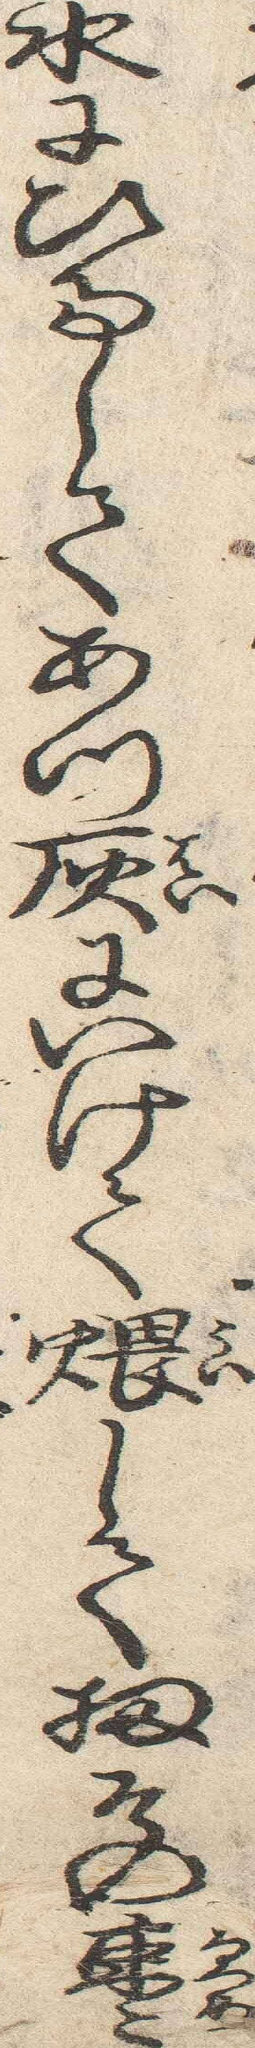水にひたしてあつ灰にいけて煨して扨その棗
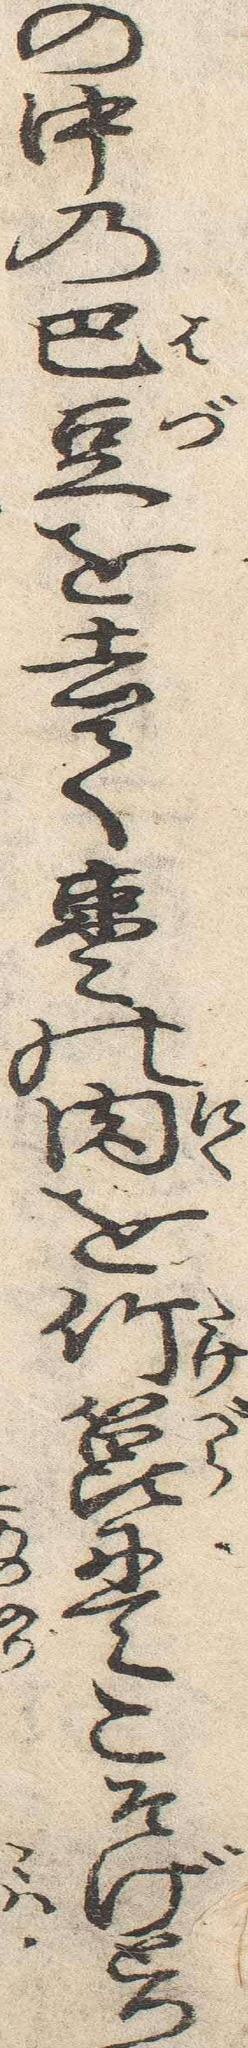の中の巴豆を去て棗の肉を竹篦にてこそげとり
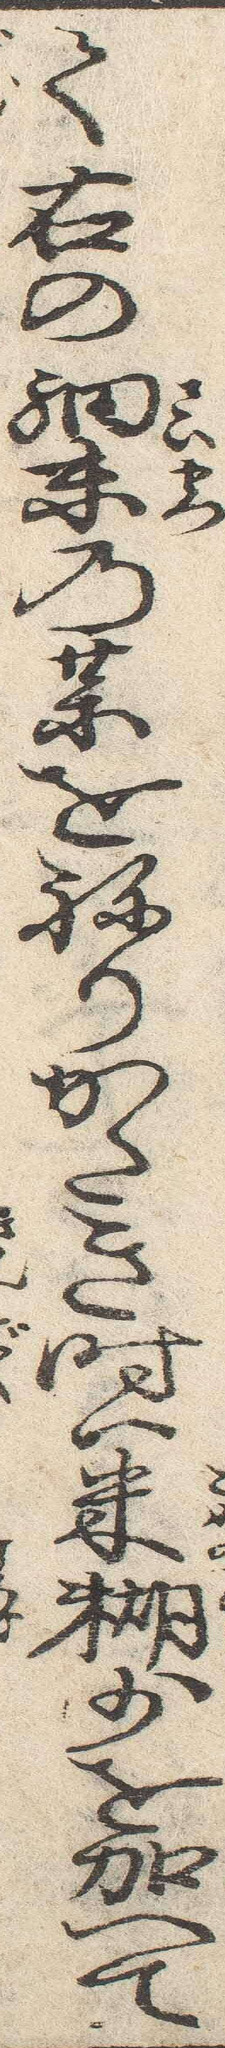て右の細末の薬をねりかたき時は米糊少を加へて
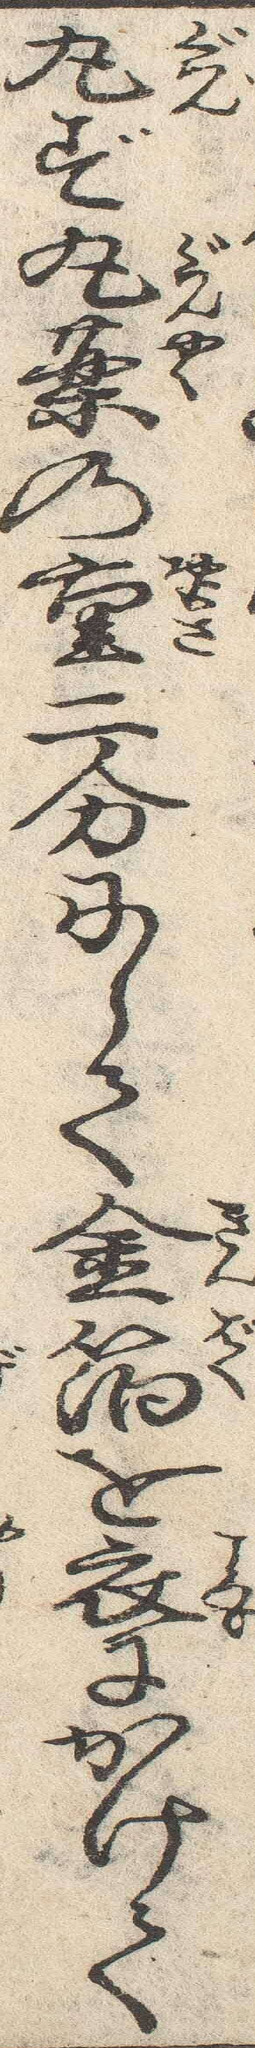丸ず丸薬の重二分にして金箔を衣にかけて
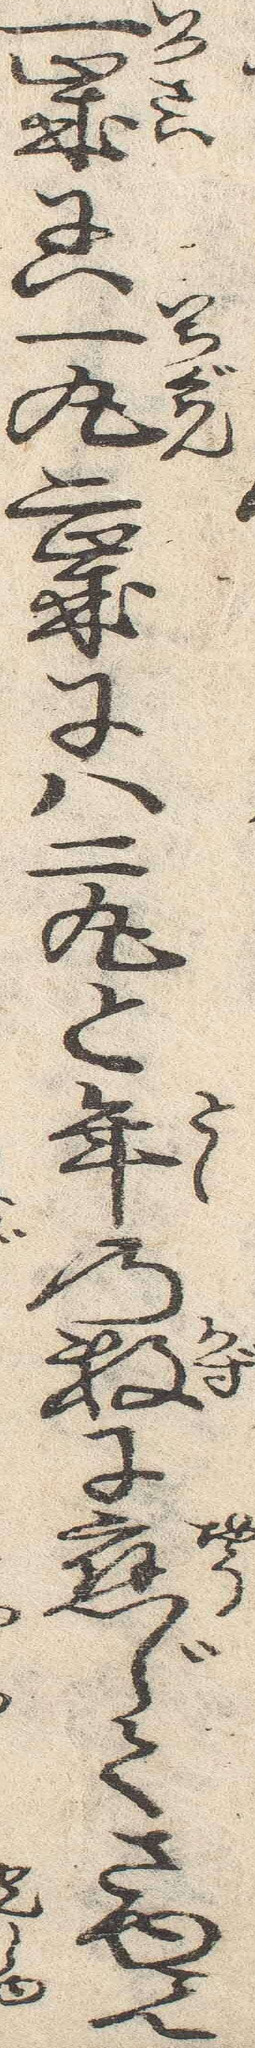一歳には一丸二歳には二丸と年の数に応じてさゆにて
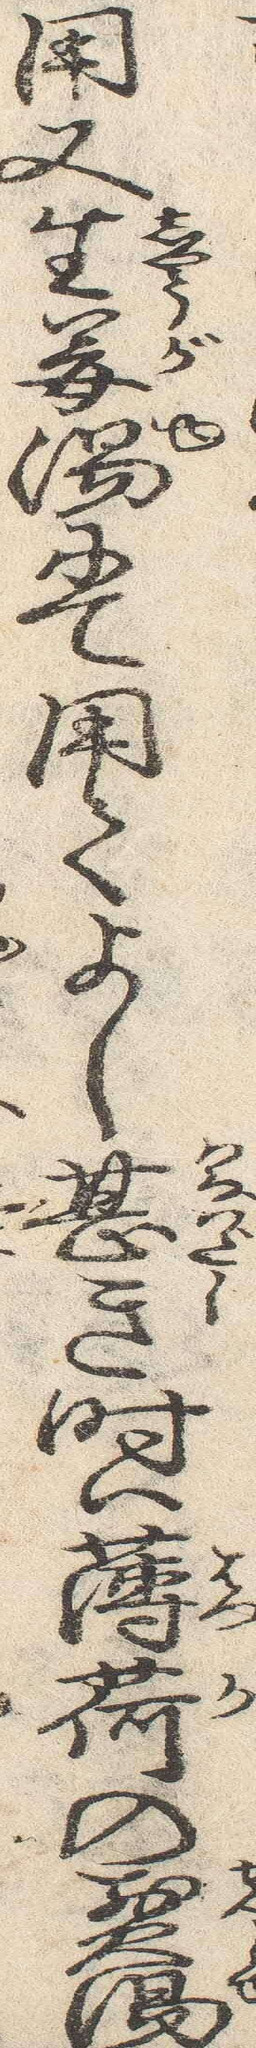用又生姜湯にて用てよし甚き時は薄荷の煎湯
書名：小児必用養育草
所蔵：東京学芸大学附属図書館 国文学研究資料館
